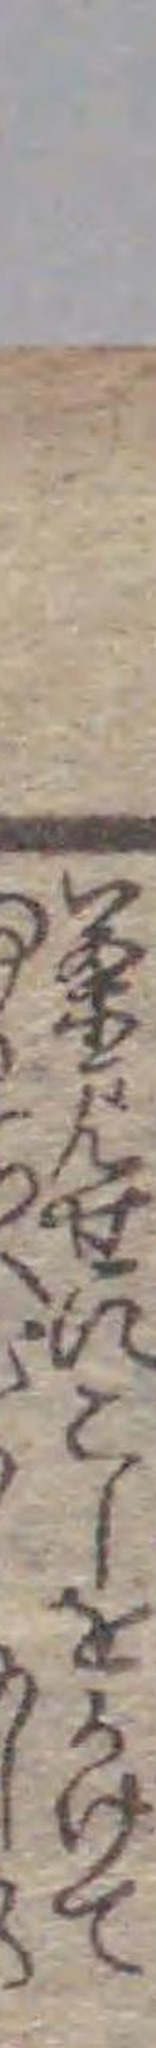茶みせにこしをかけて
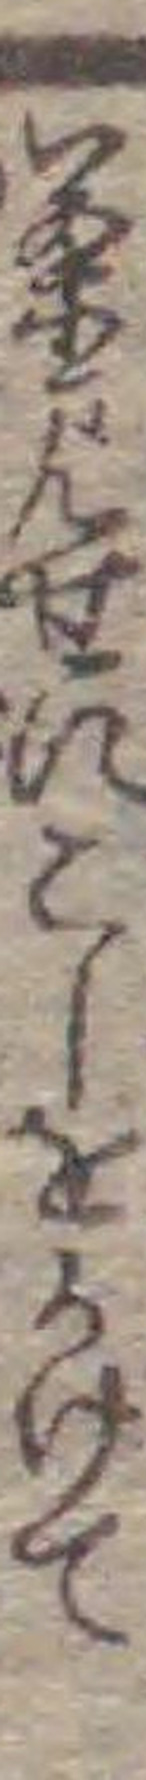茶みせにこしをかけて
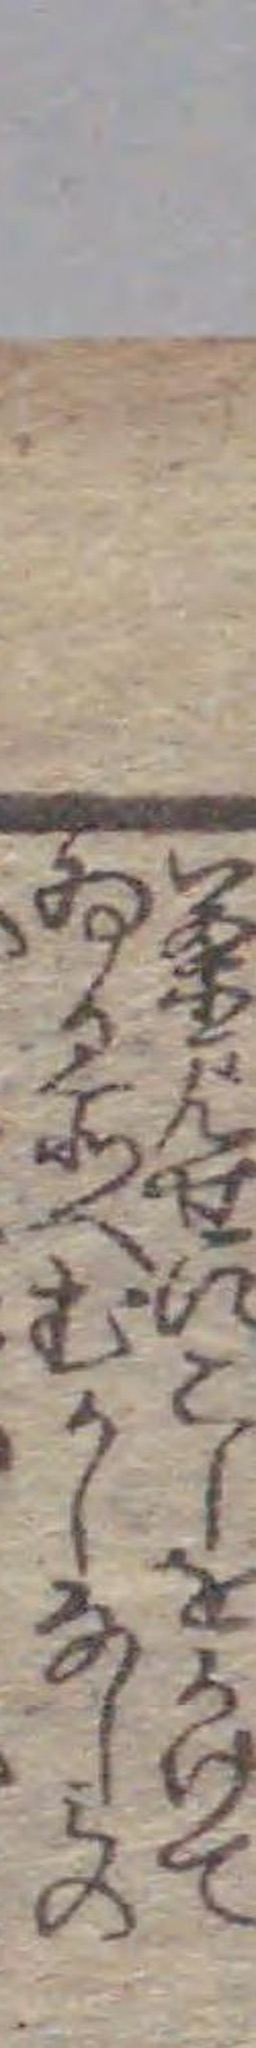ゐる所へむかしなしみの
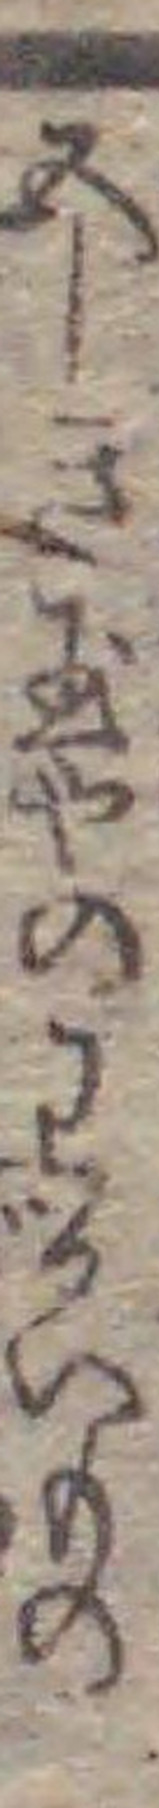五しき玉やのわかいもの
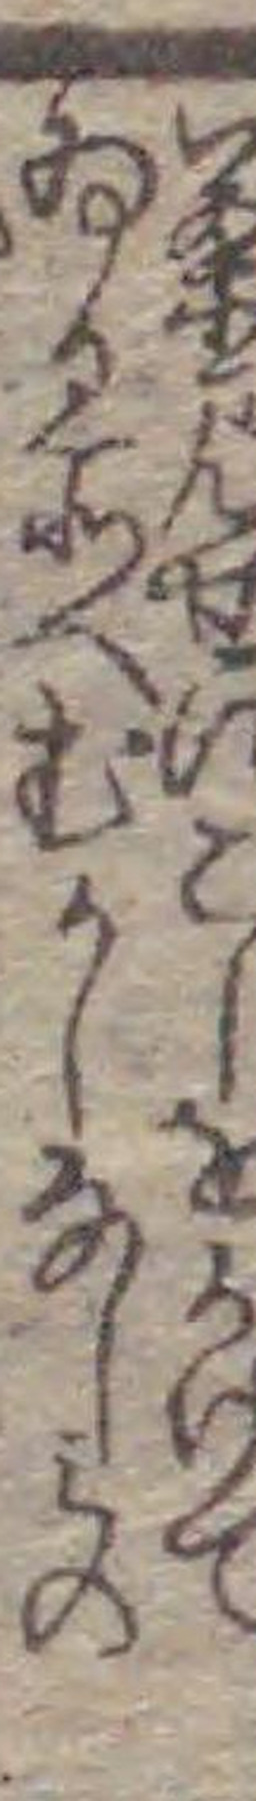ゐる所へむかしなしみの
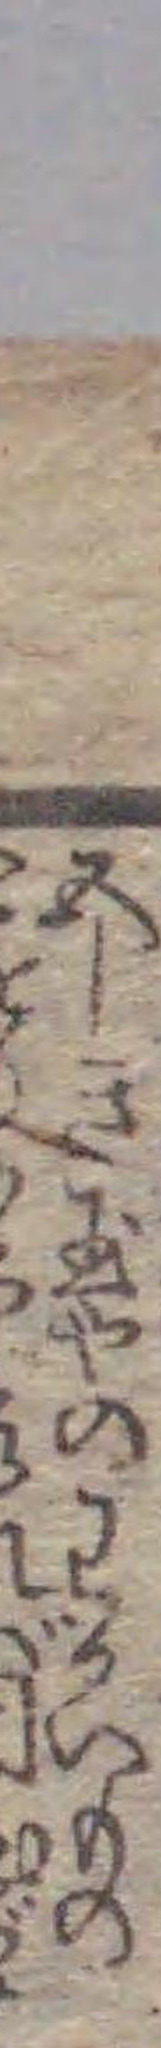五しき玉やのわかいもの
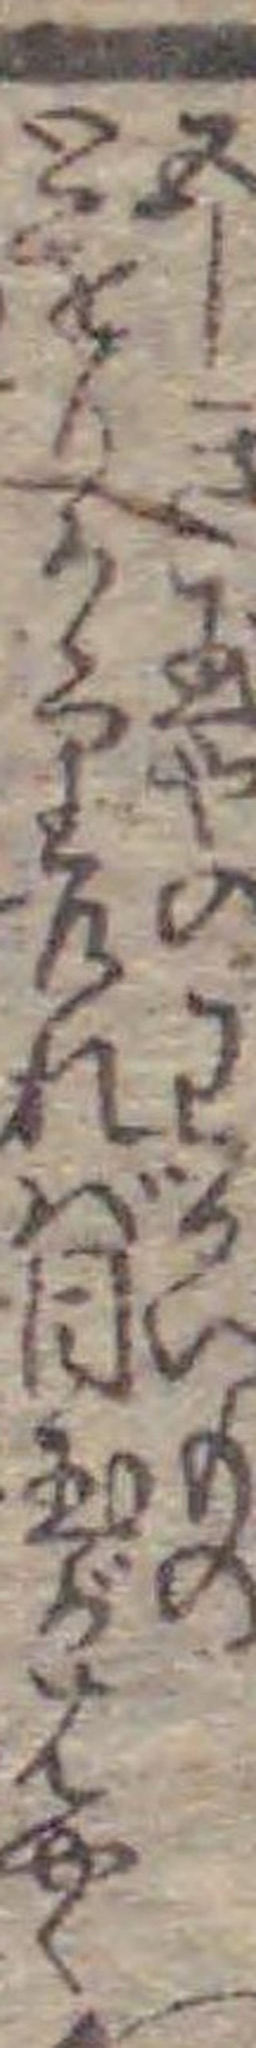とをりかゝりければ目玉がはやく
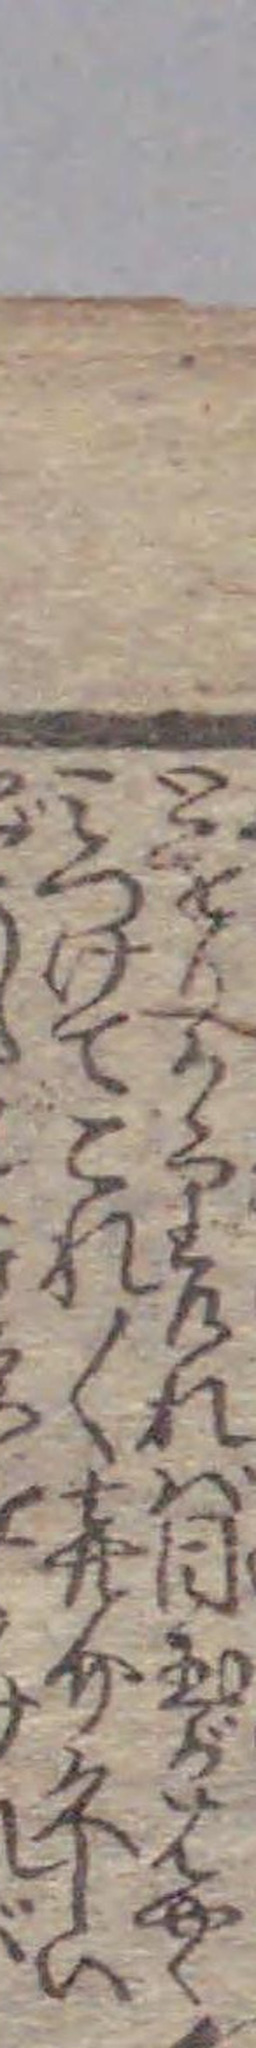みつけてこれ〳〵喜介久しい
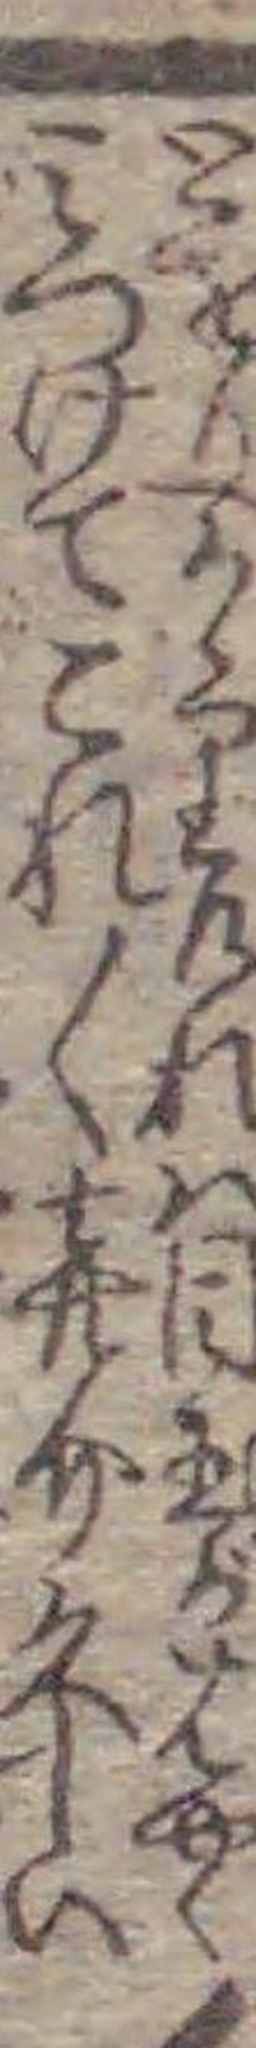みつけてこれ〳〵喜介久しい
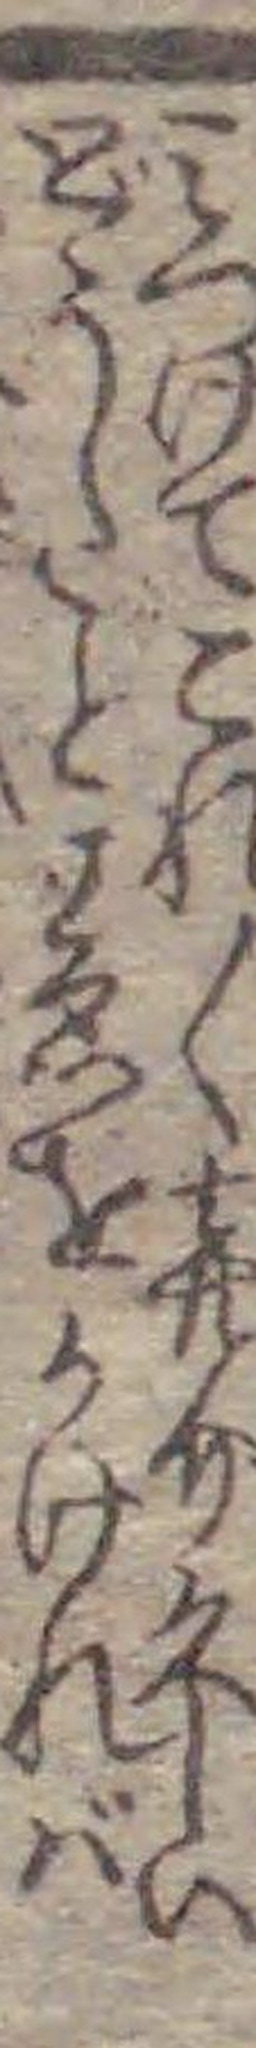どうたとこゑをかければ
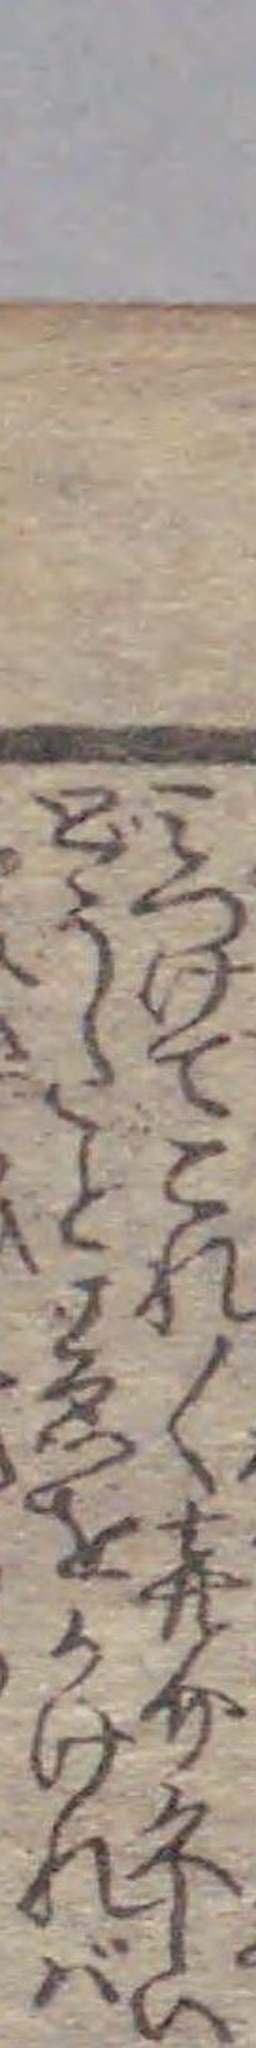どうたとこゑをかければ
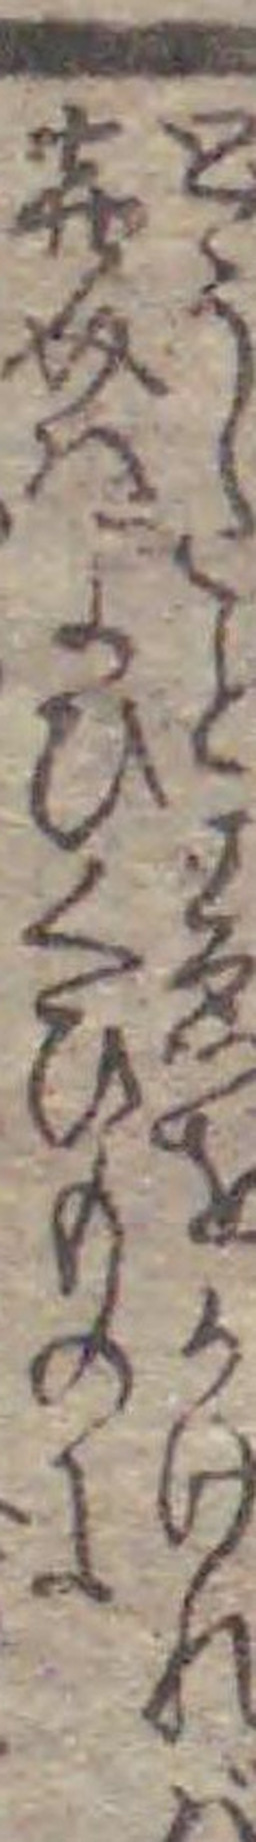喜介はよひくひものに
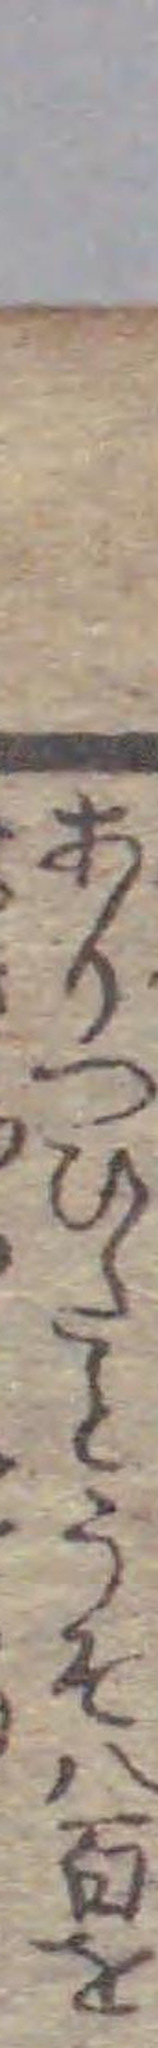ありつひたとうそ八百を
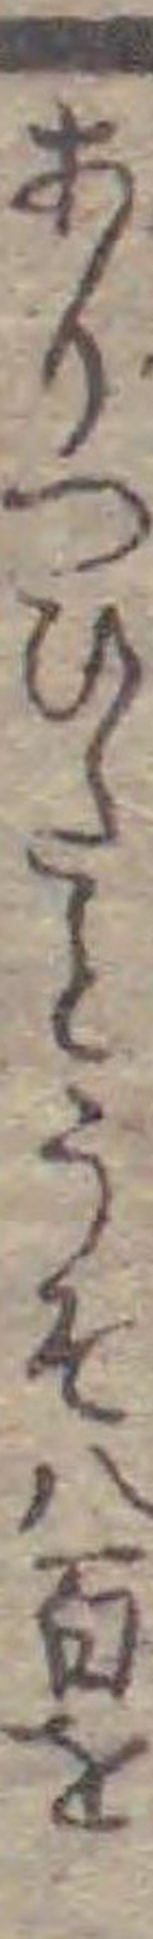ありつひたとうそ八百を
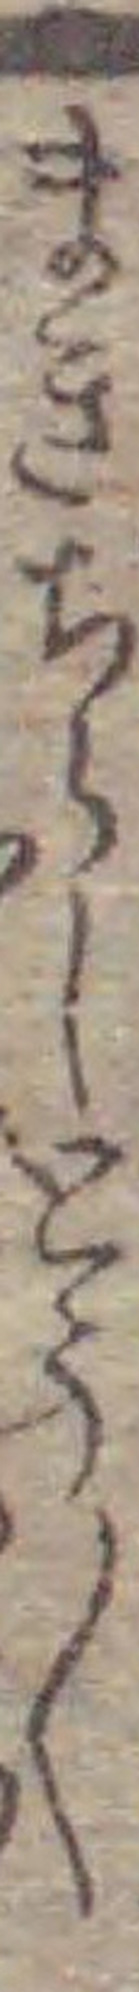まきちらしとう〳〵
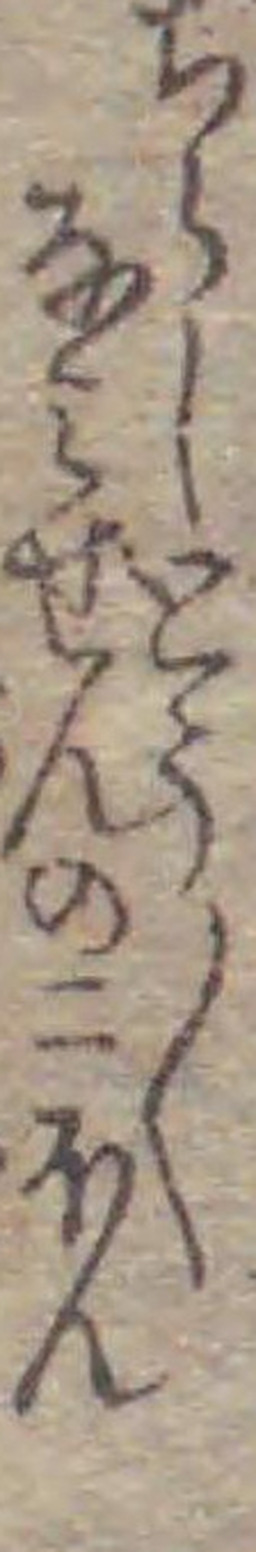なみせんの二ほん
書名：四遍搨心学草帋 : 3巻
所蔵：国立国会図書館 National Diet Library, JAPAN
